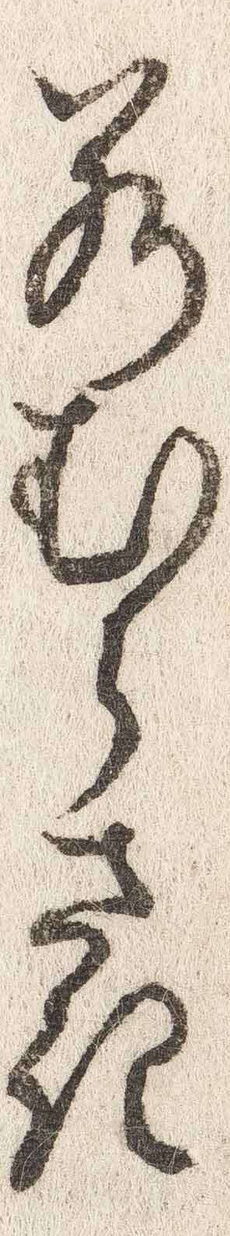若むらさき
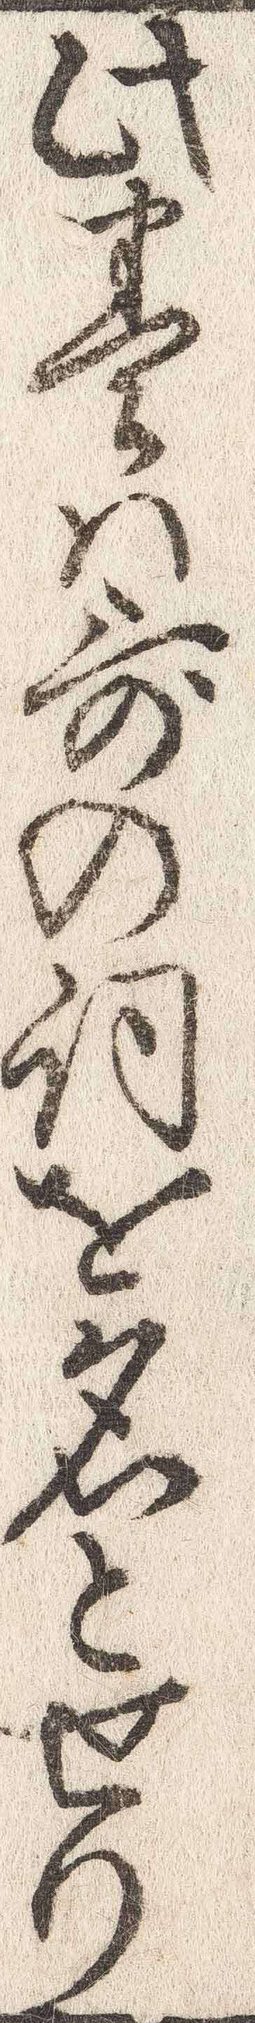此巻は歌の詞を名とせり
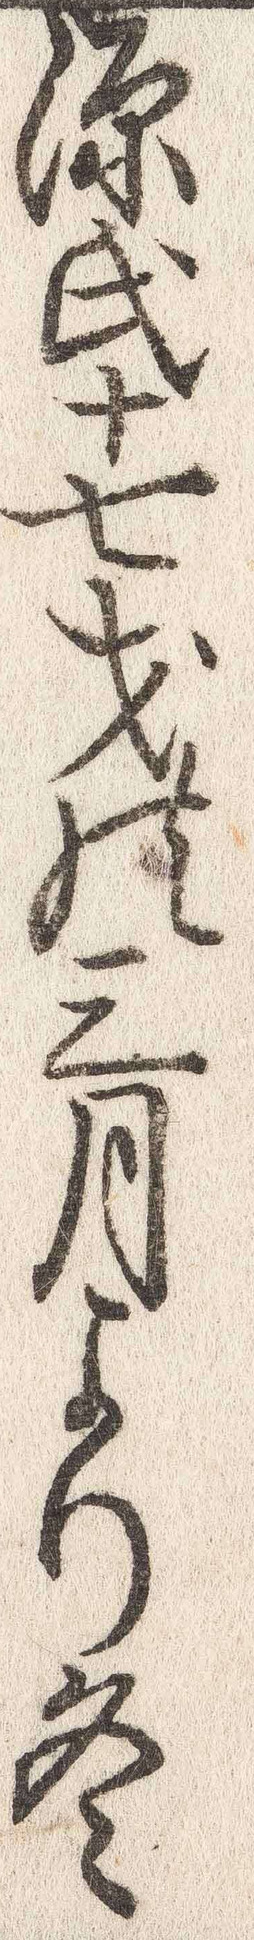源氏十七才の三月より冬
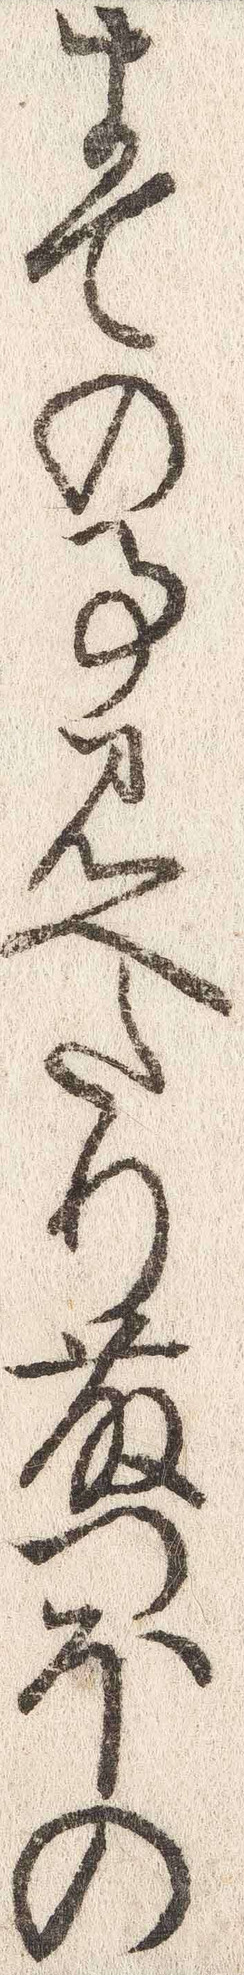まての事見へたり藤つほの
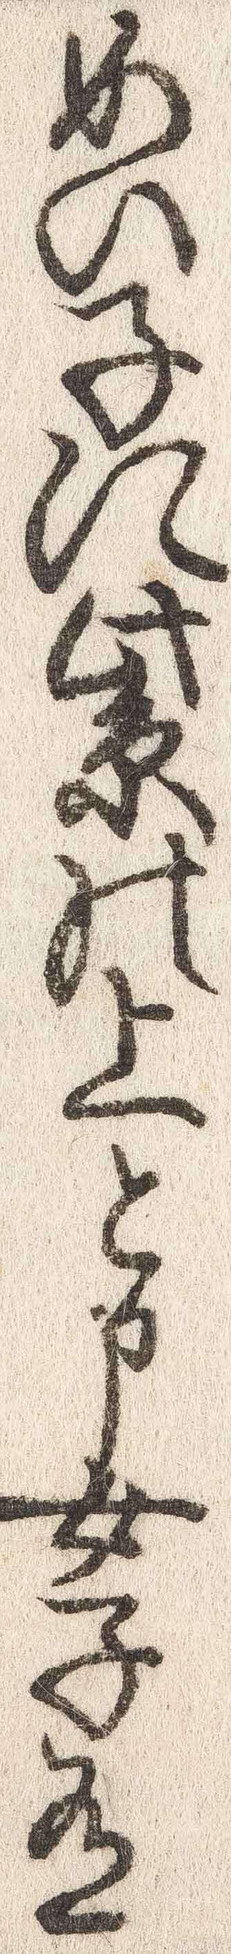めい子に紫の上と申女子有
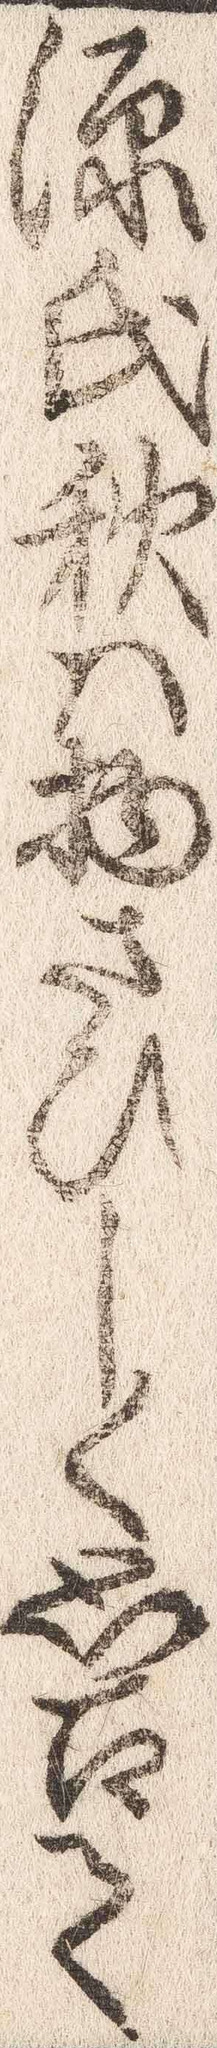源氏秋は物さひしく思召て
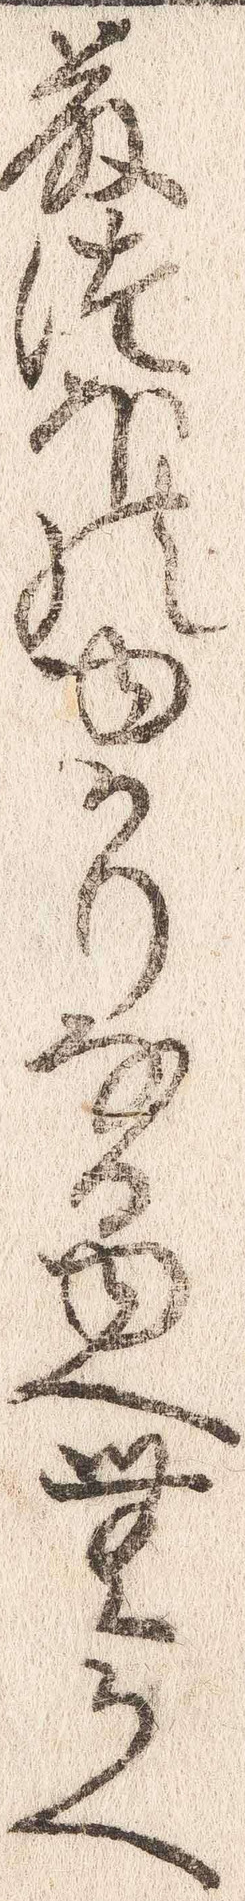藤つほのゆかりなるゆへむかへ
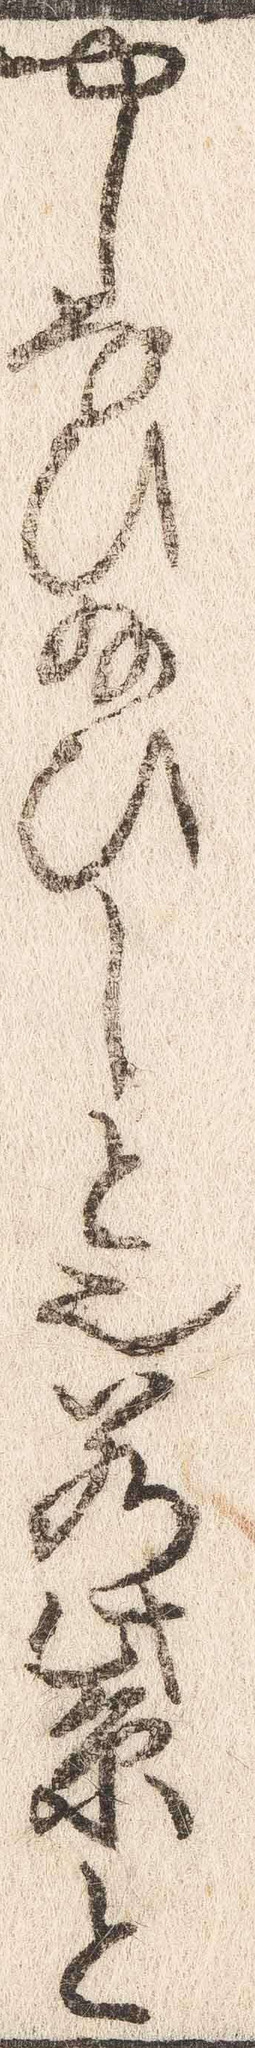やしなひ給ひしと也若紫と
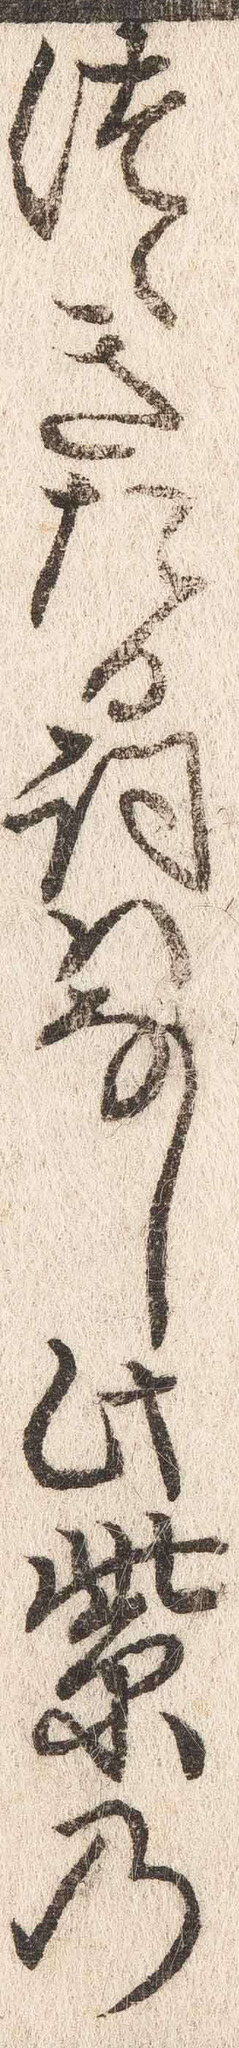つゝきたる詞はなし此紫の
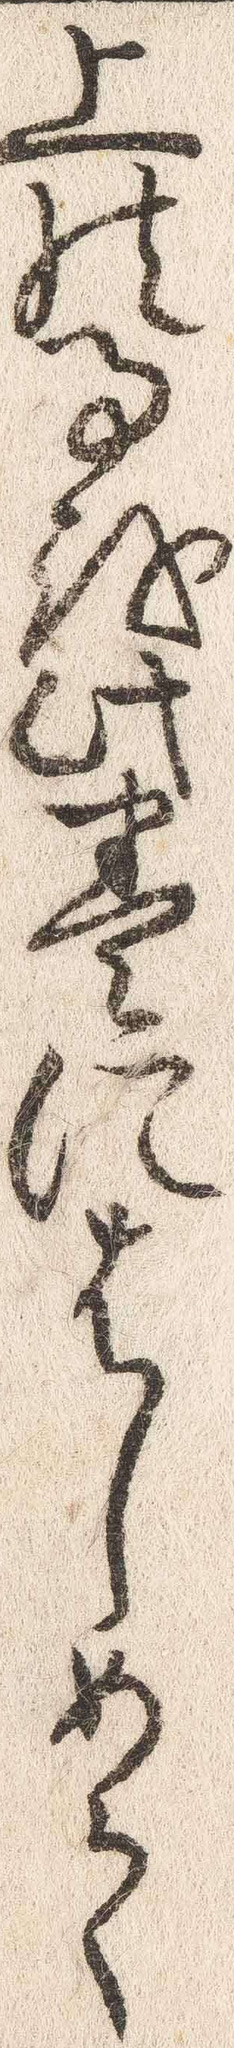上の事を此巻にはしめて

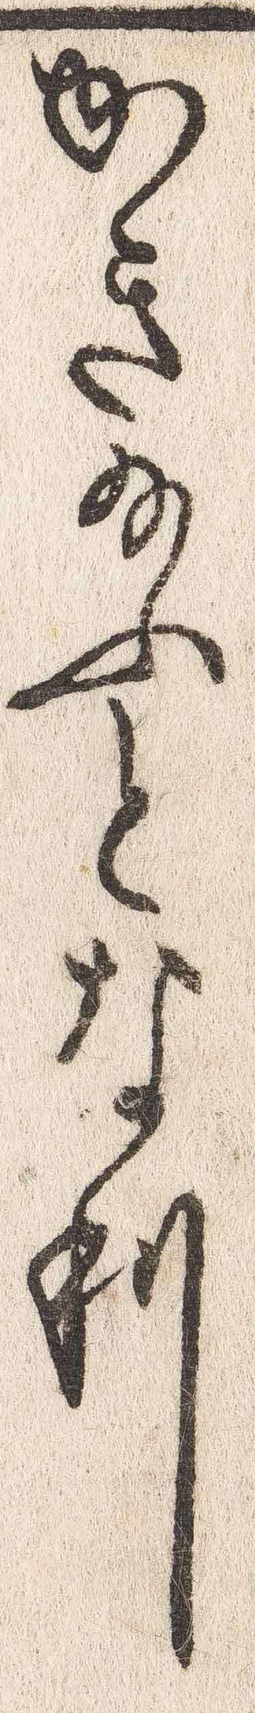かき給ふとなり
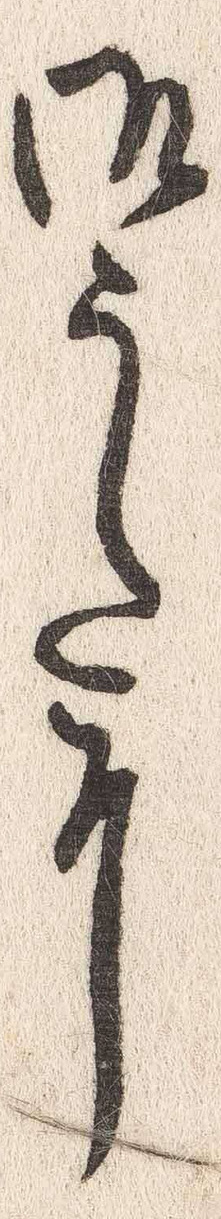御うたに
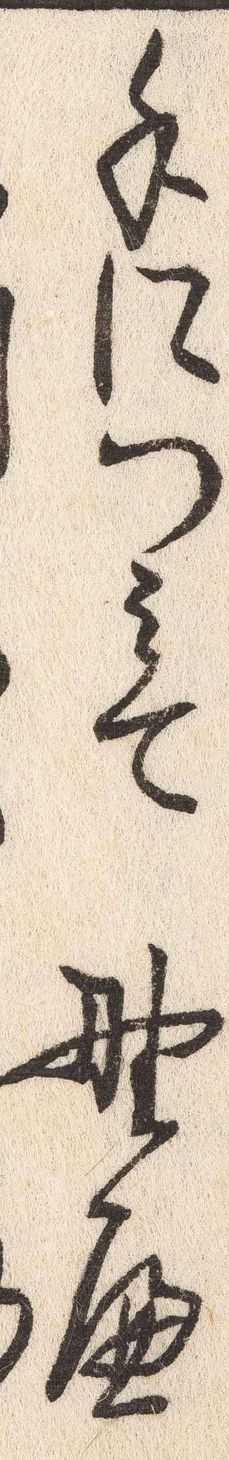手につみて野辺
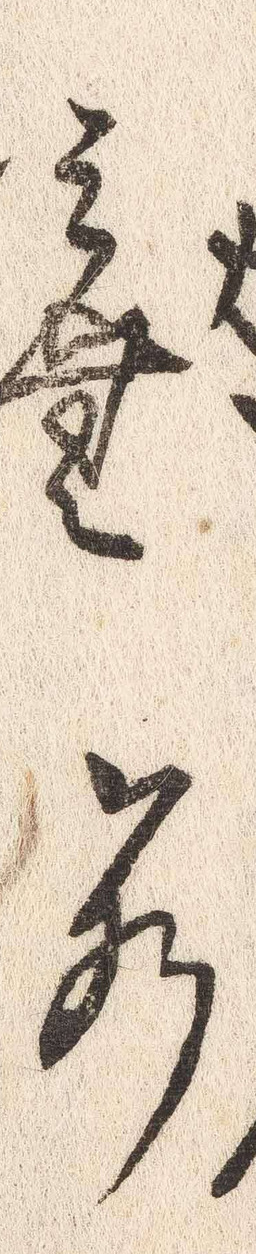みむ若
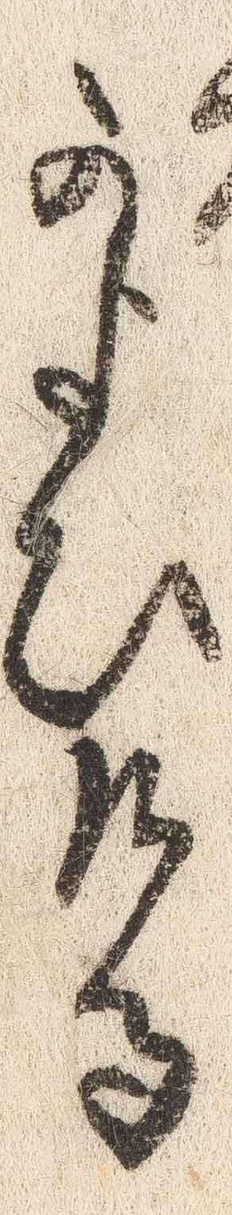かよひける

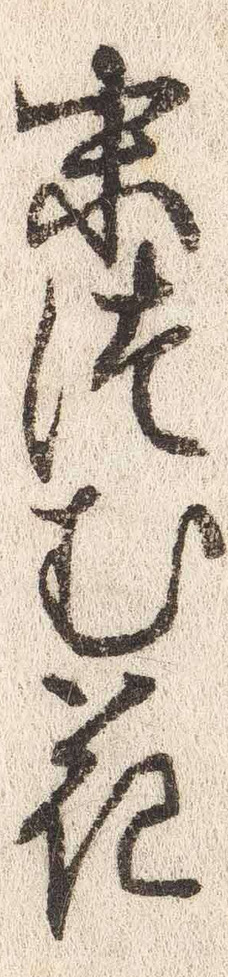末つむ花
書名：源氏物語
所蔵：東京学芸大学附属図書館 国文学研究資料館
